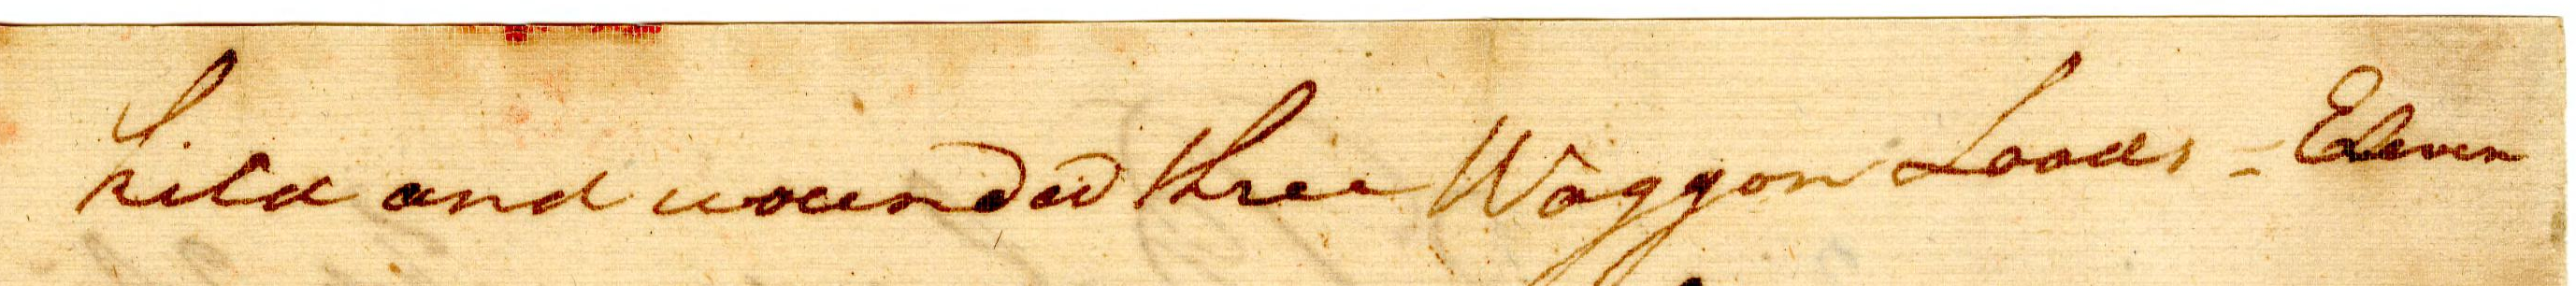kild and wounded three Waggon Loads. Eleven
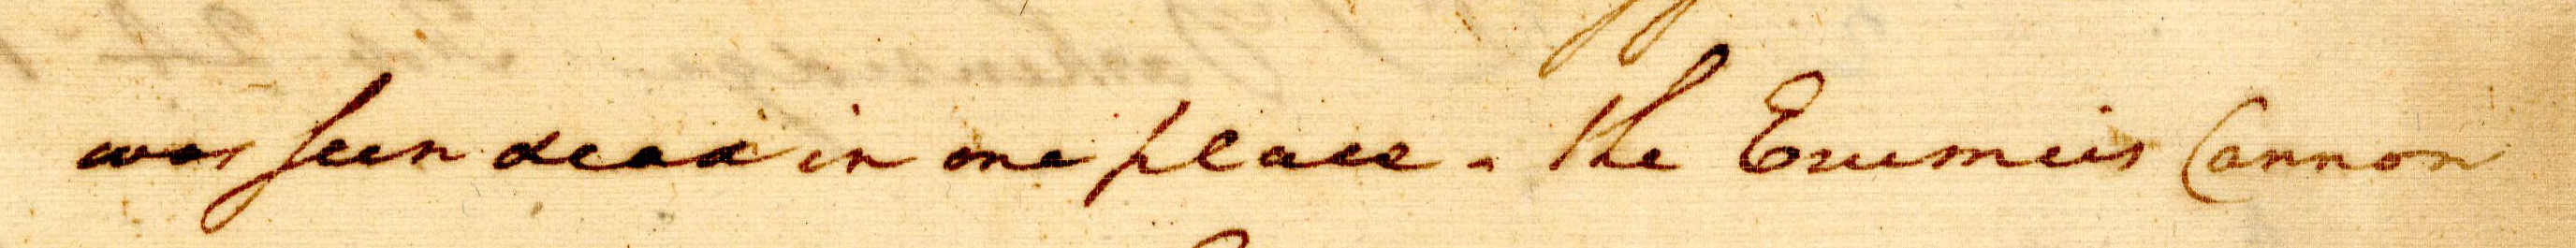was seen dead in one place. the Enemies Cannon
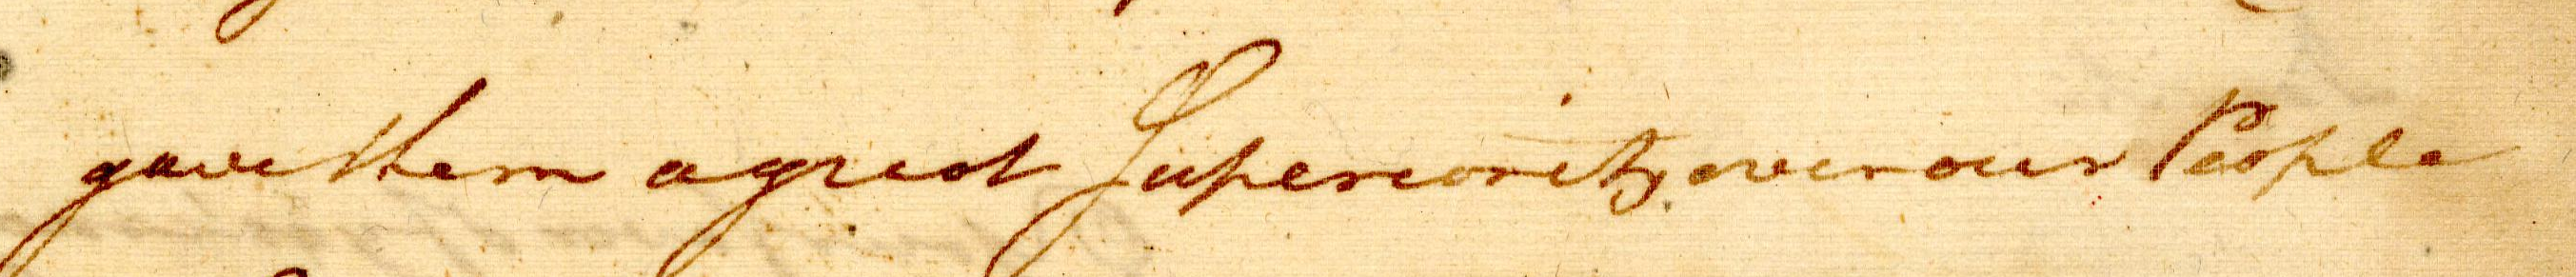gave them a great Superiority over our People
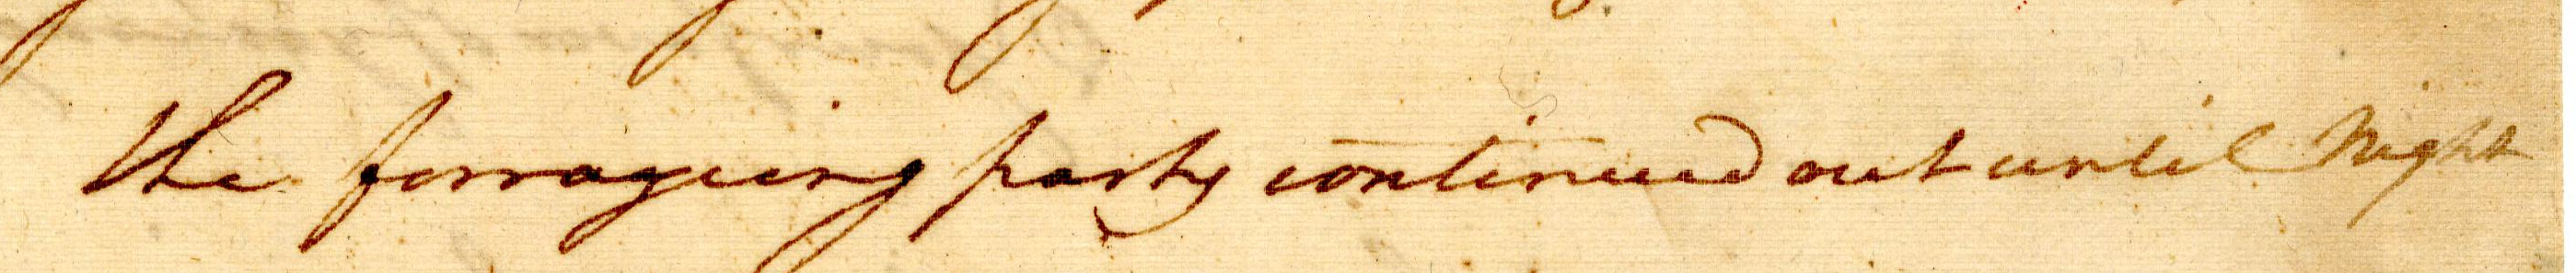the forraging party continued out until night
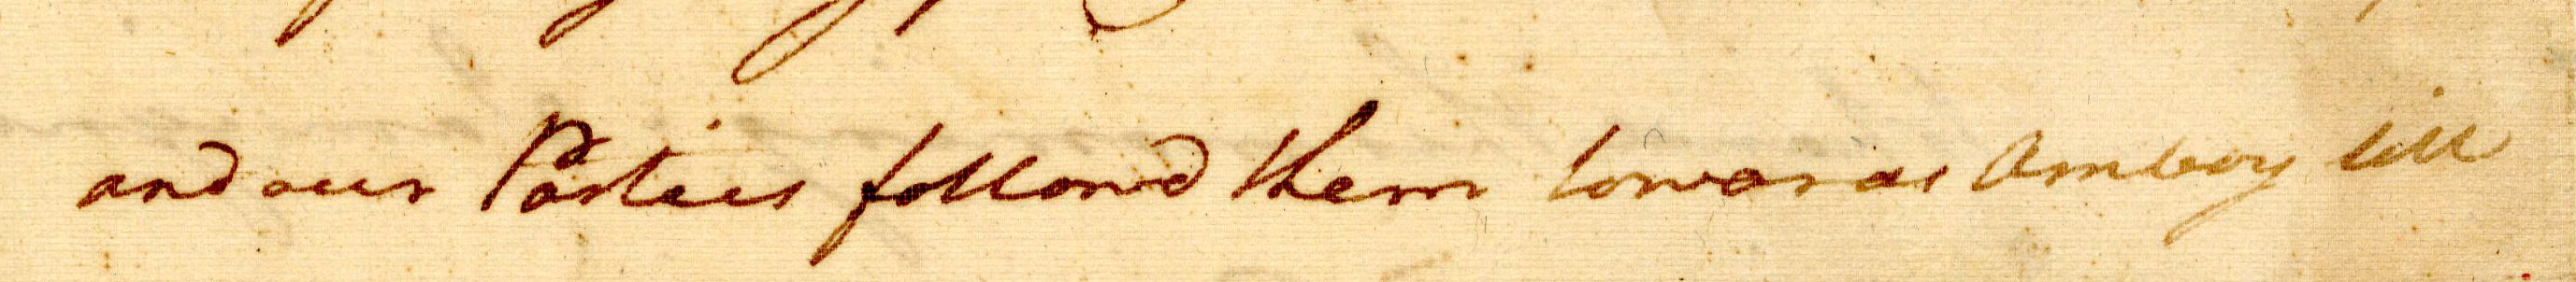and our Parties followd them towards Amboy till
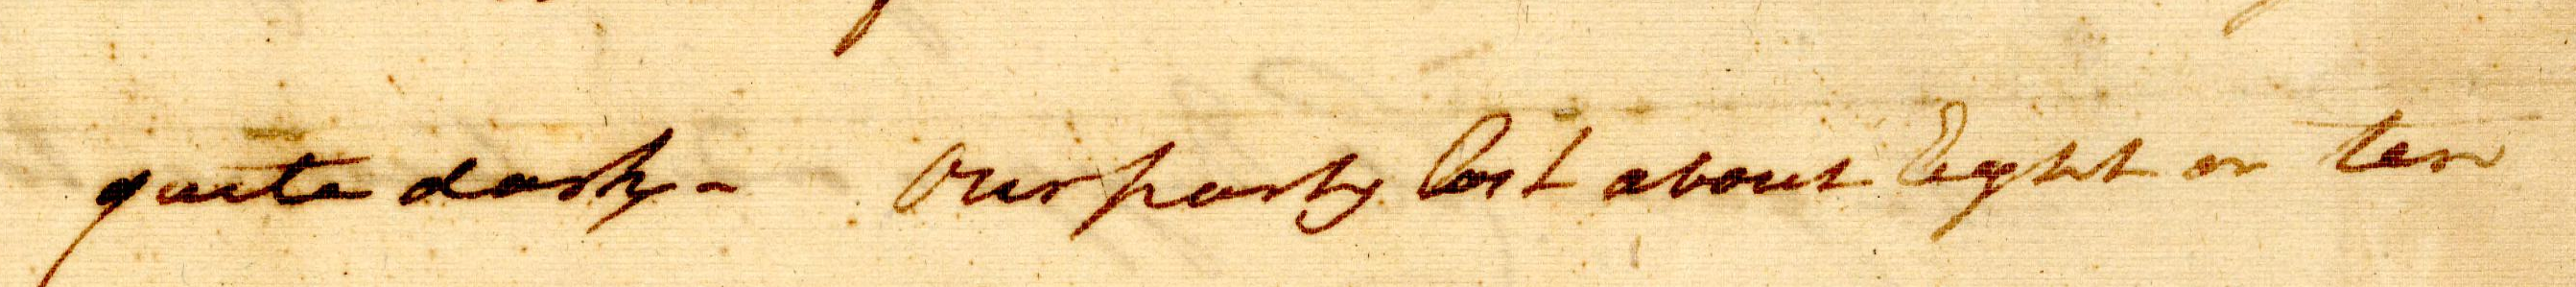quite dark. Our party lost about Eight or ten
